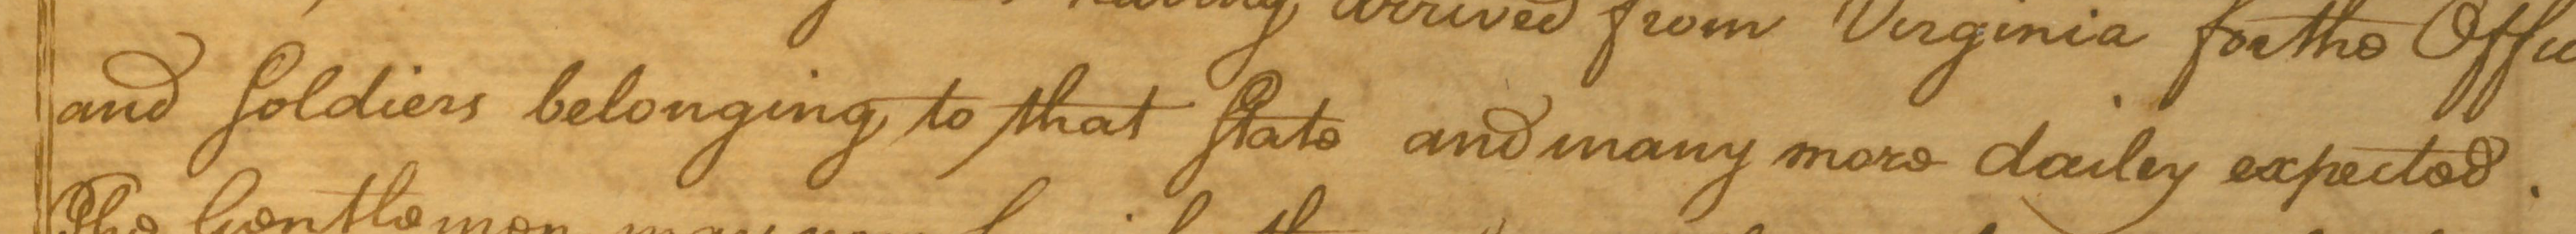and soldiers belonging to that state and many more dailey expected.
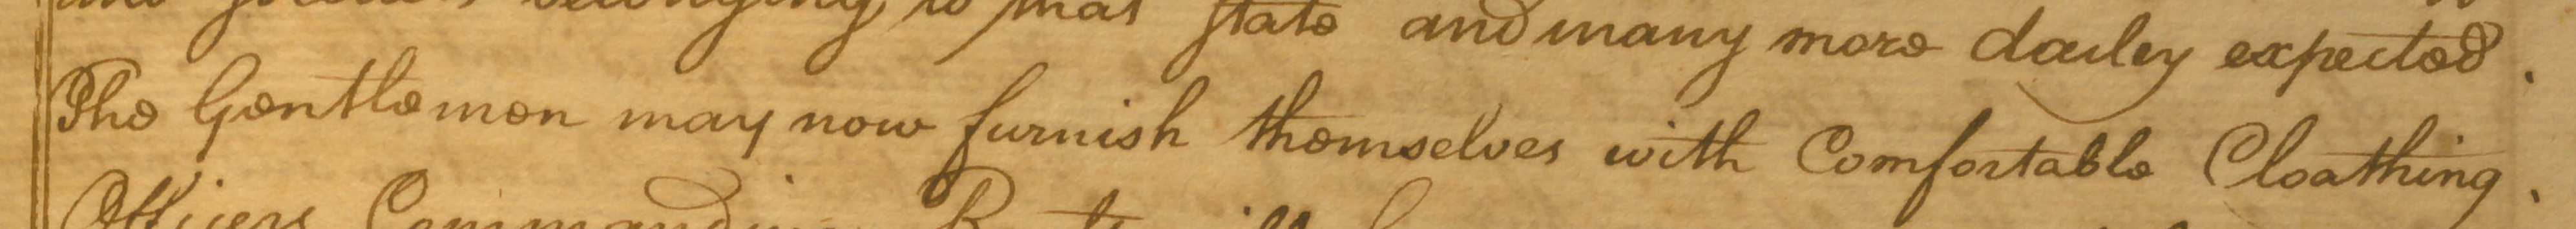The Gentlemen may now furnish themselves with Comfortable Cloathing.
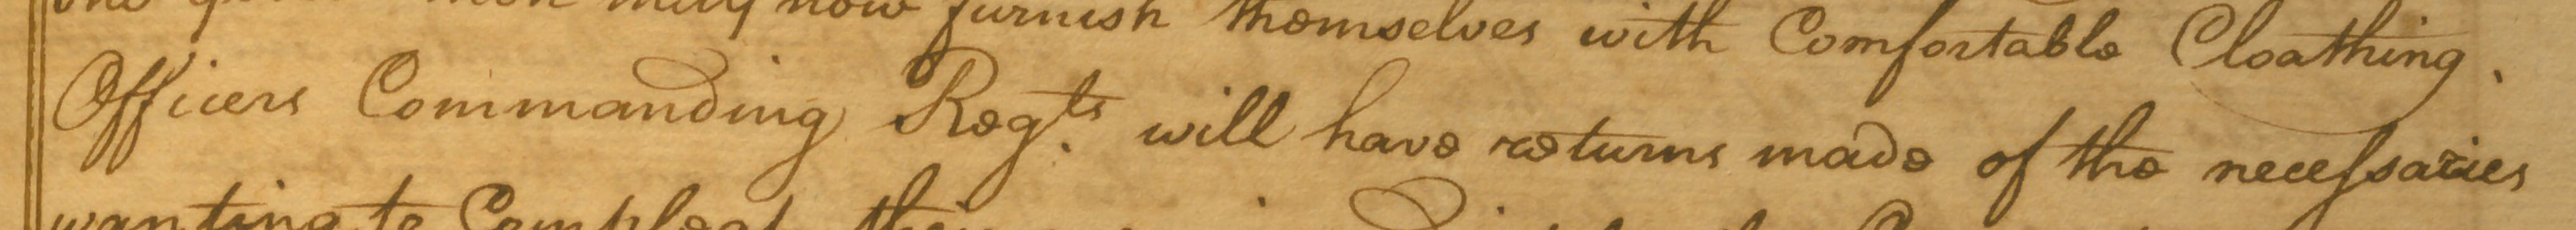Officers Commanding Reg^ts. will have returns made of the necessaries
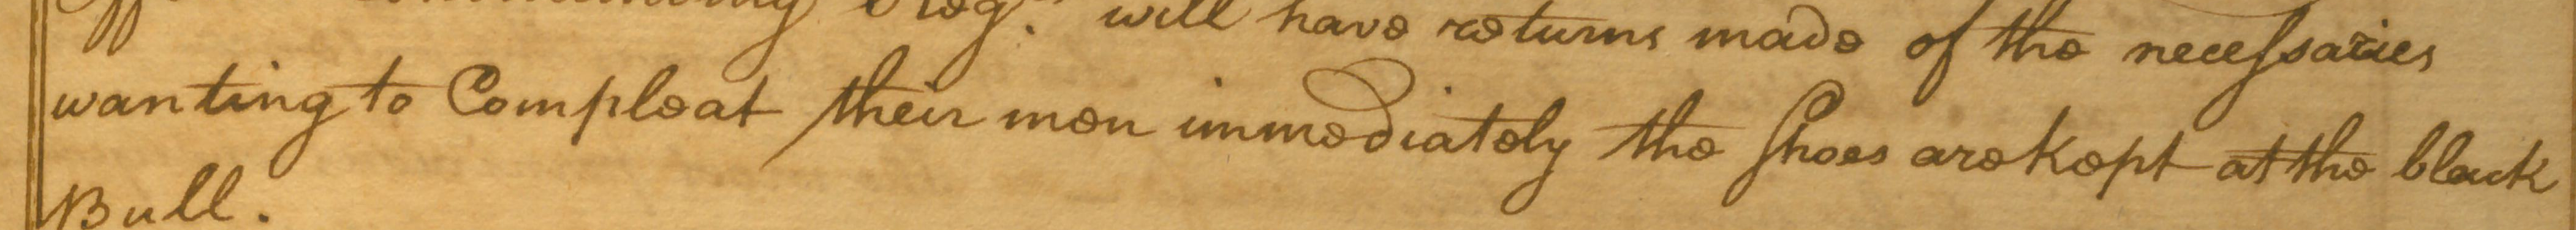wanting to Compleat their men immediately the shoes are kept at the black
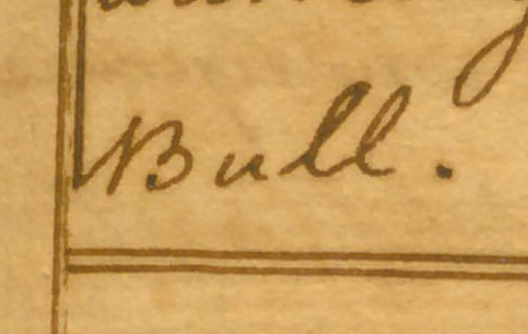Bull.
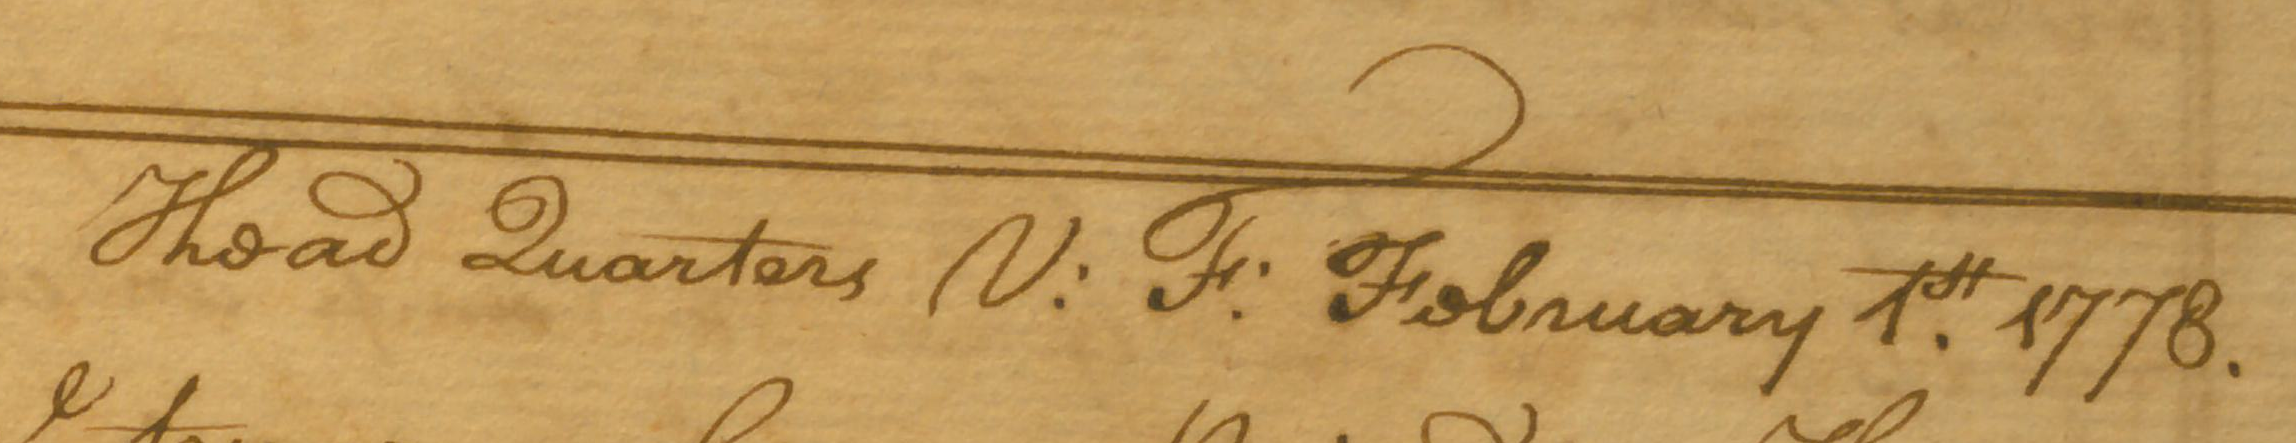Head Quarters V: F: February 1^st. 1778.
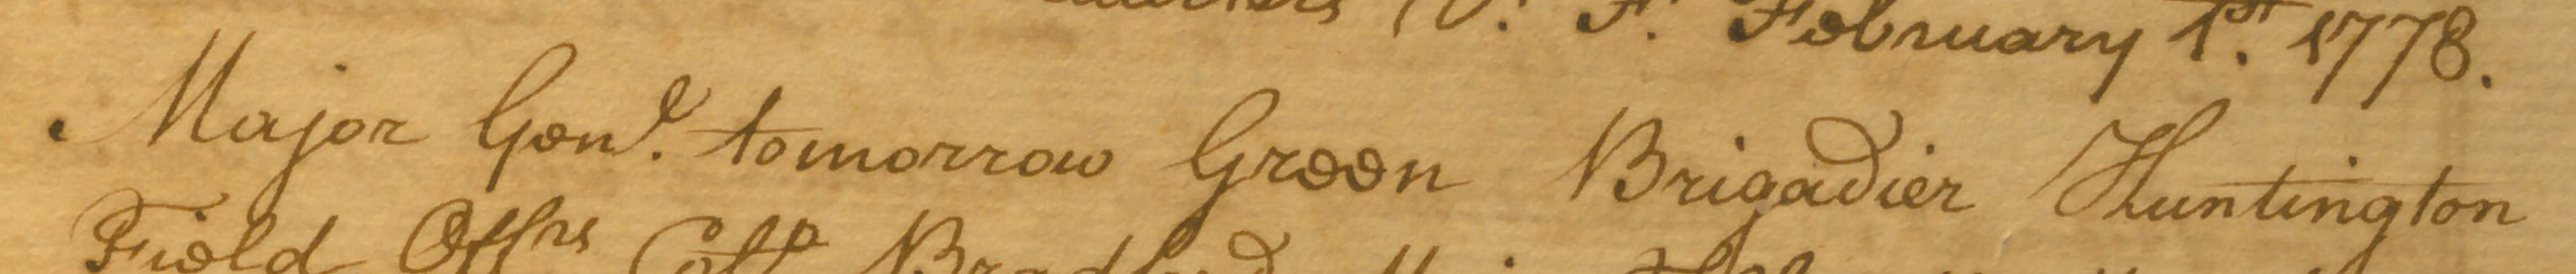Major Gen^l. tomorrow Green Brigadier Huntington
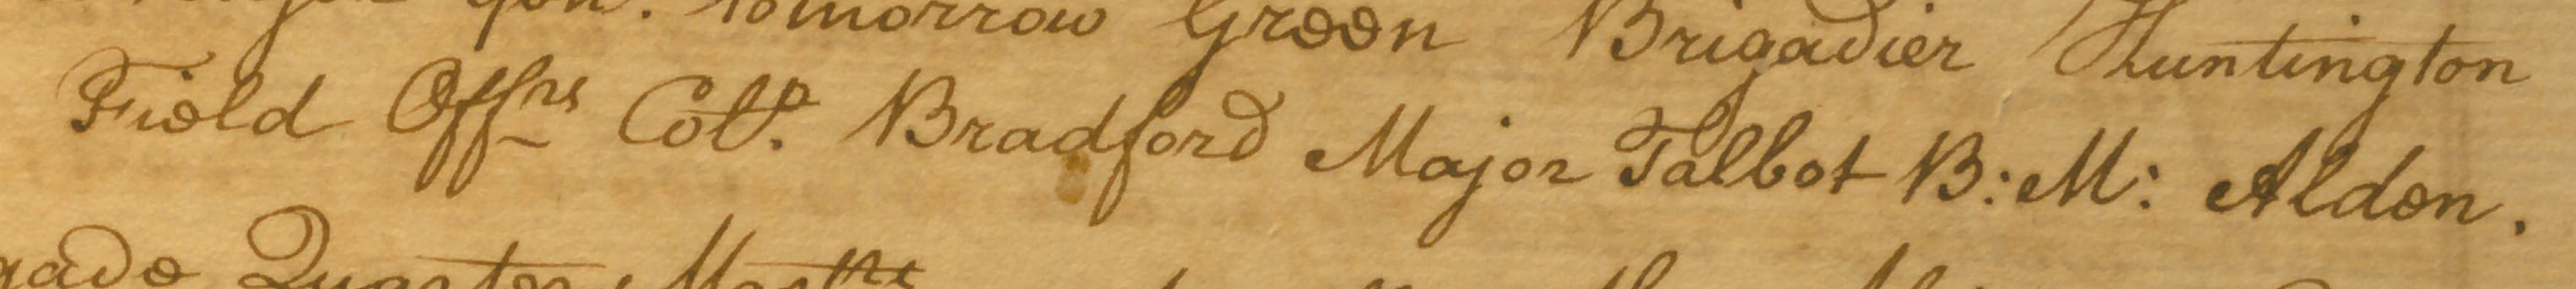Field Off^rs. Col^o. Bradford Major Talbot B: M: Aldon.
